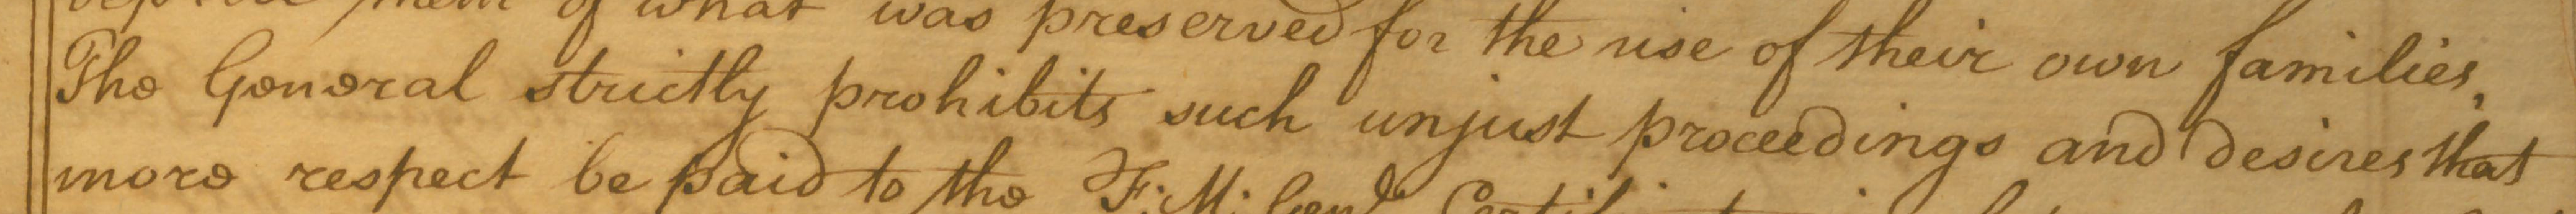The General strictly prohibits such unjust proceedings and desires that
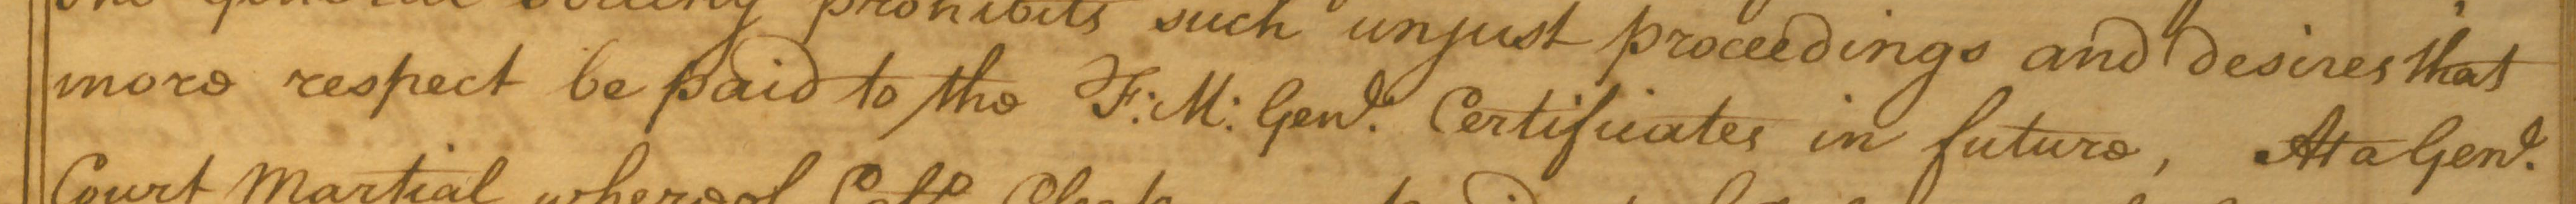more respect be paid to the F: M: Gen^l. Certificates in future. At a Gen^l.
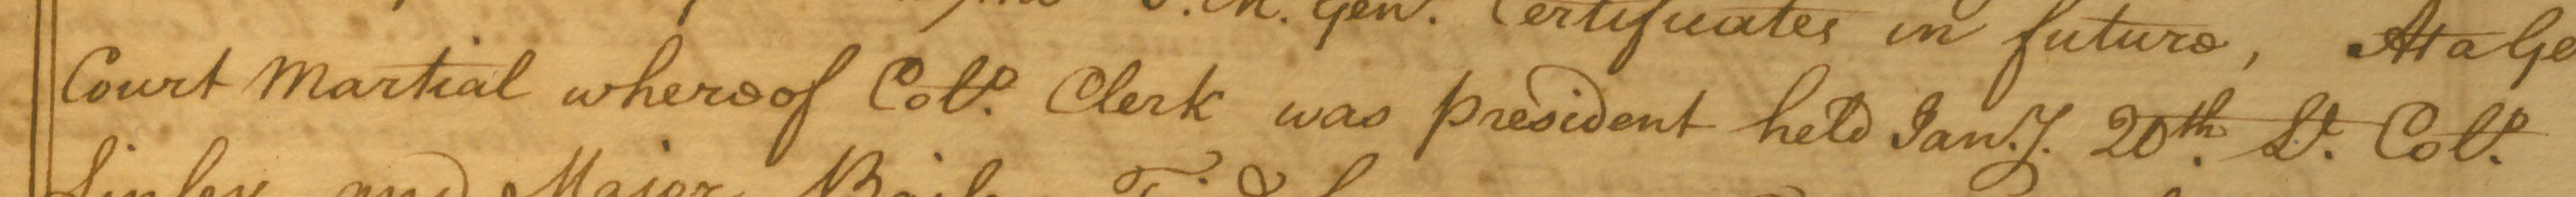Court Martial whereof Col^o. Clerk was president held Jan^y. 20^th. L^t. Col^o.
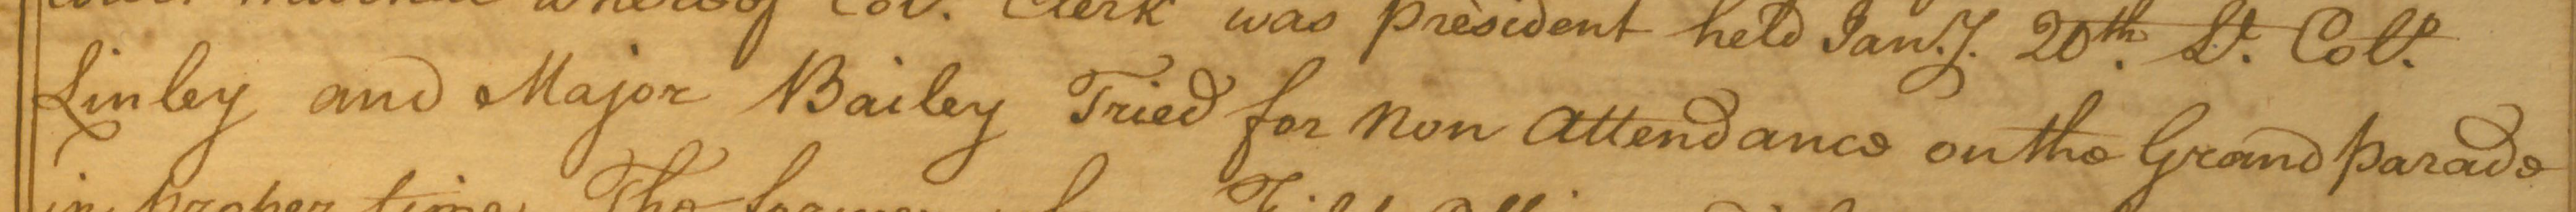Linley and Major Bailey Tried for non attendance on the Grand parade
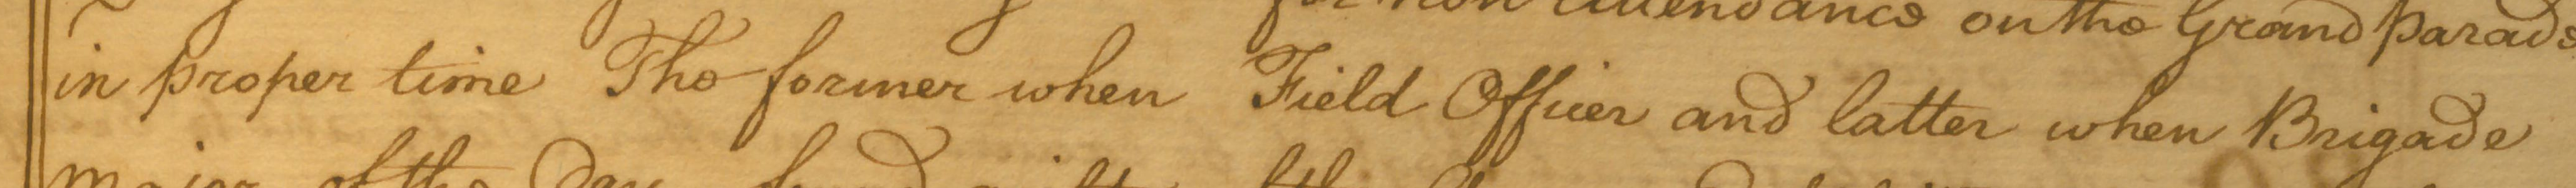in proper time The former when Field Officer and latter when Brigade
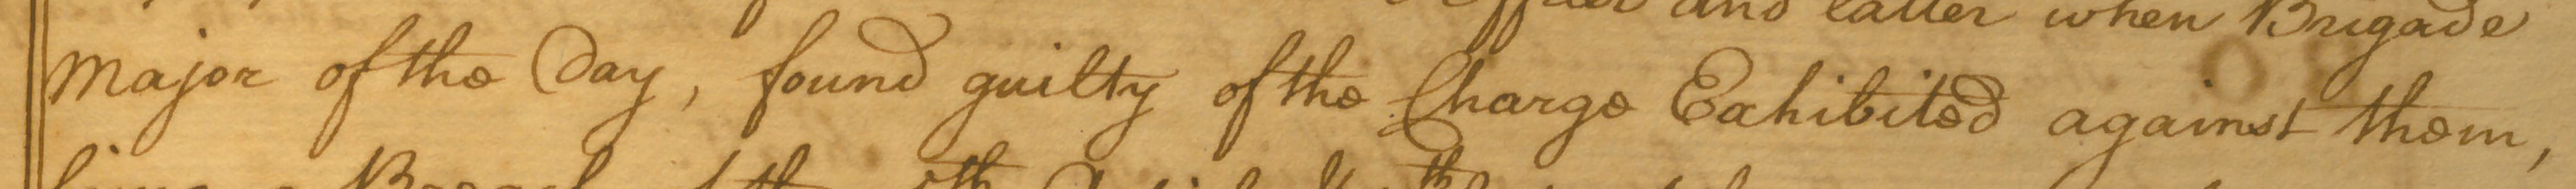major of the day, found guilty of the Charge Exhibited against them,
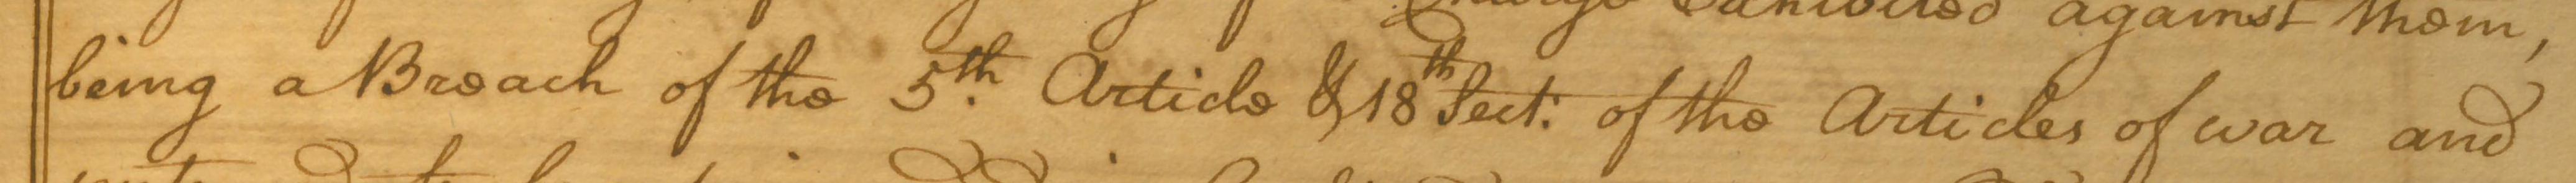being a Breach of the 5^th. Article & 18^th Sect: of the Articles of war and
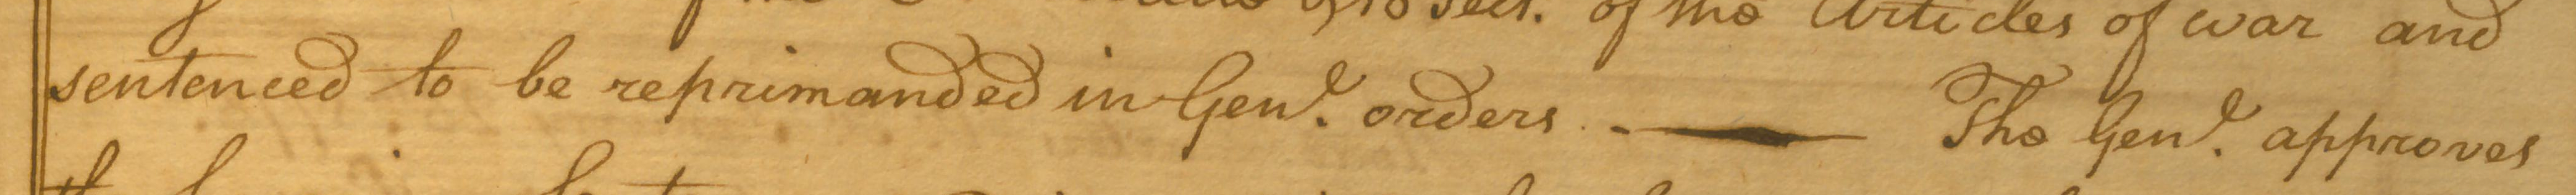sentenced to be reprimanded in Gen^l. orders- The Gen^l. approves
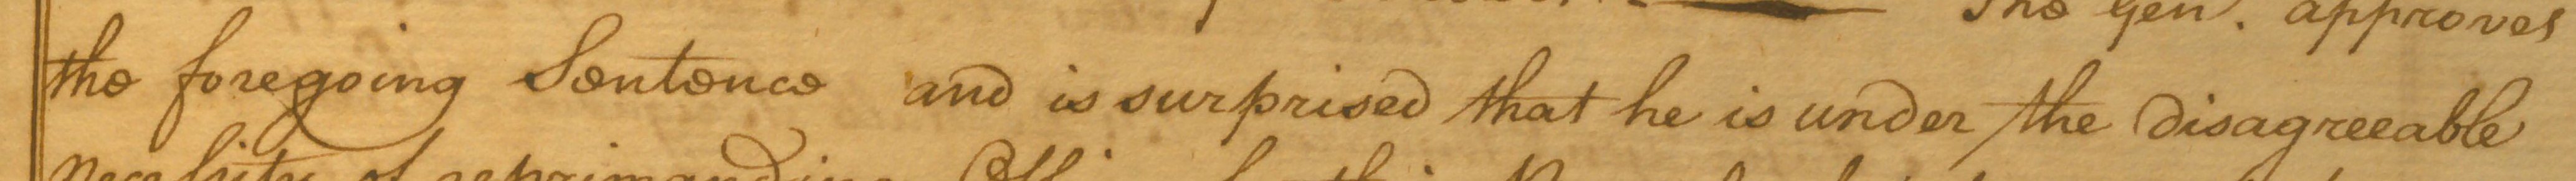the foregoing Sentence and is surprised that he is under the disagreeable
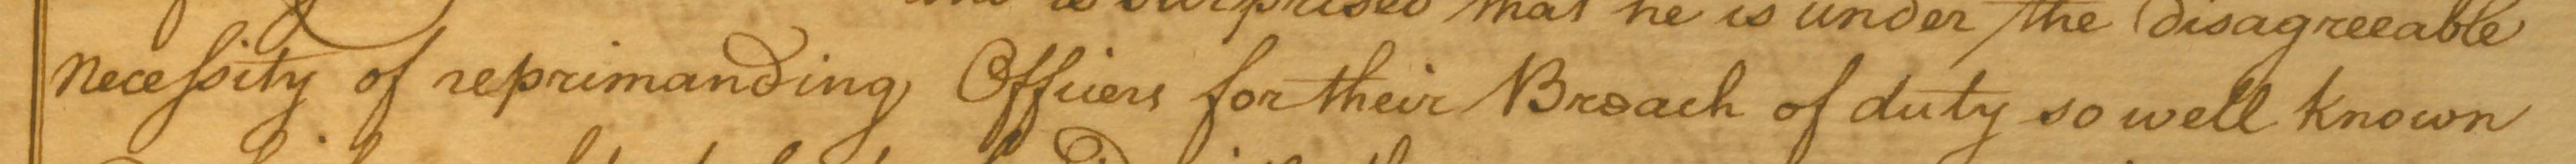necessity of reprimanding Officers for their Breach of duty so well known
